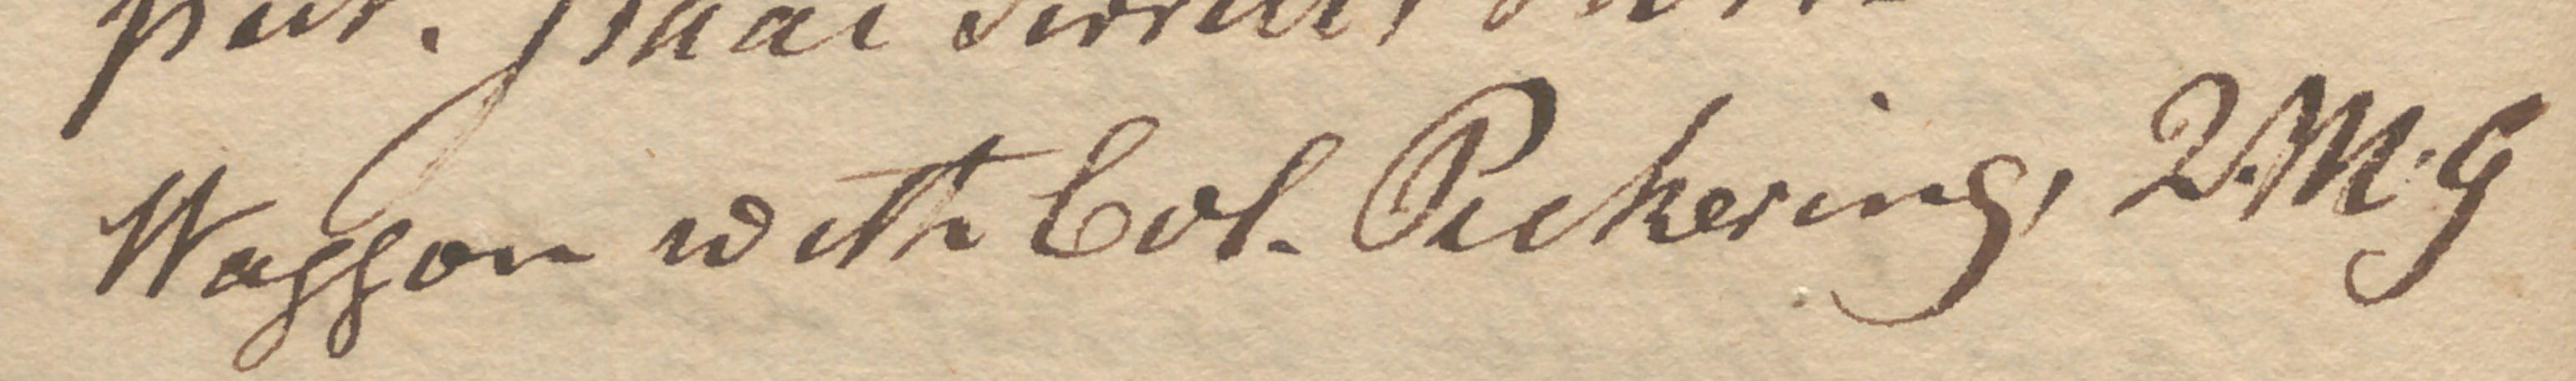Waggon with Col. Pickerings Q.M.G
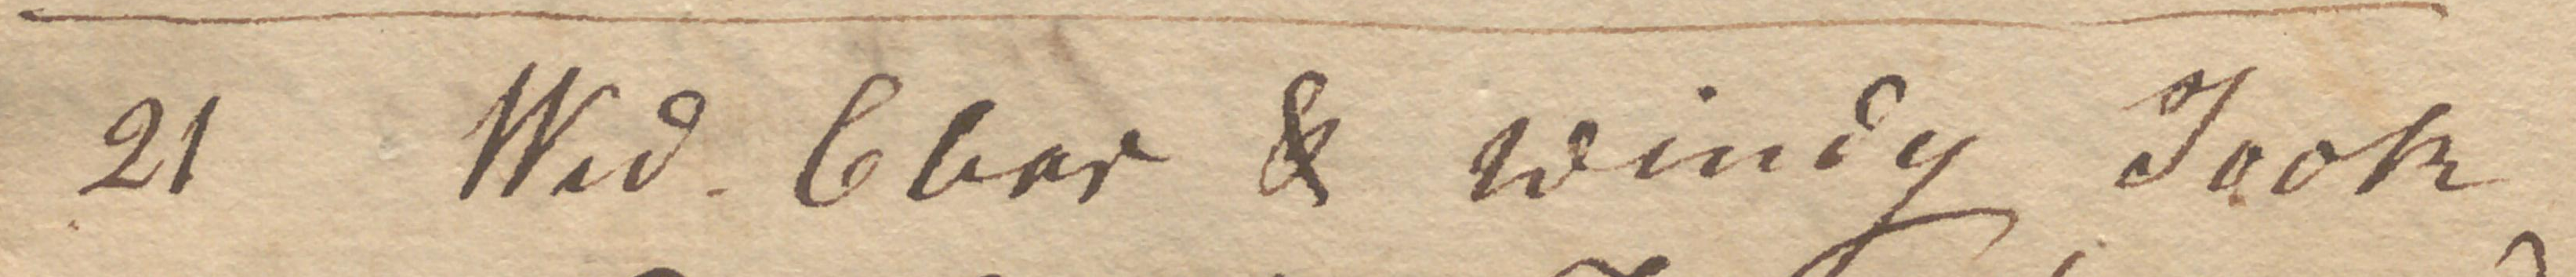21 Wed. Clear & windy Took
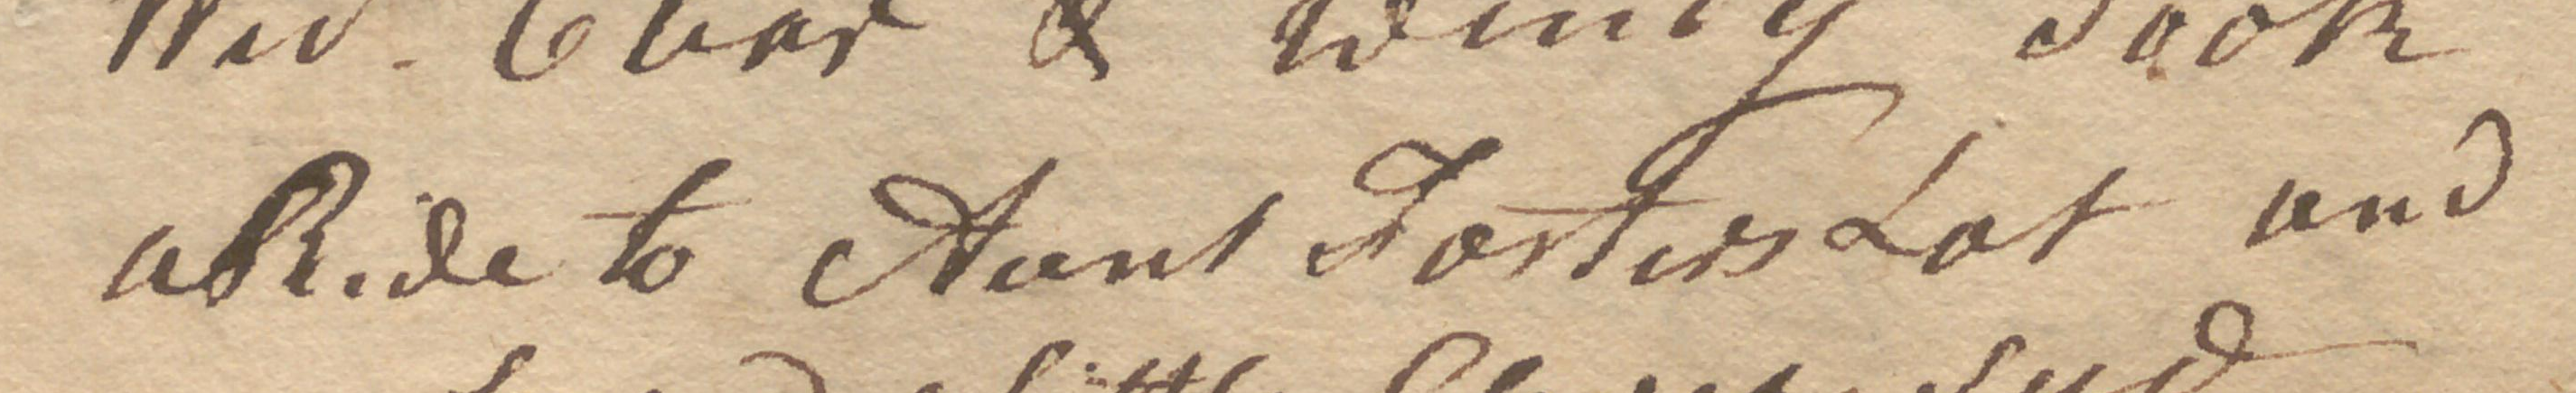a Ride to Aunt Fosters Lot and
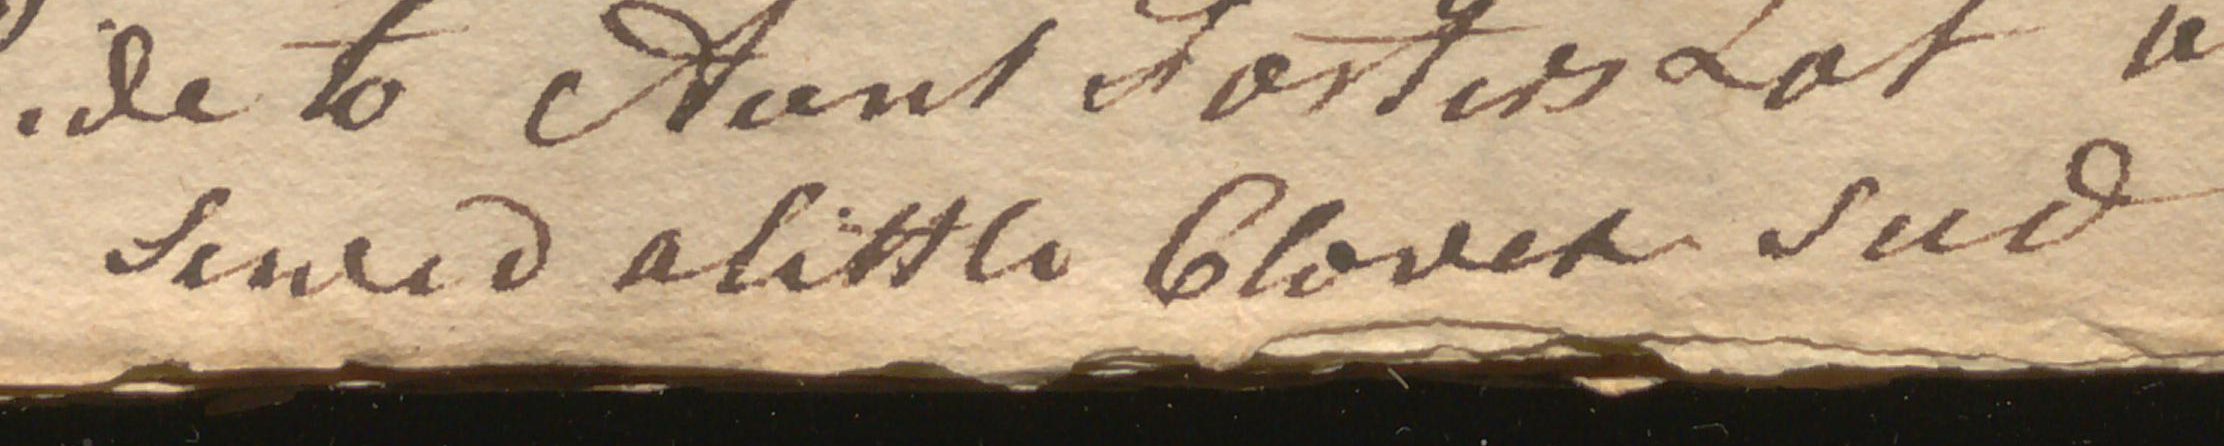sewed a little Clover seed
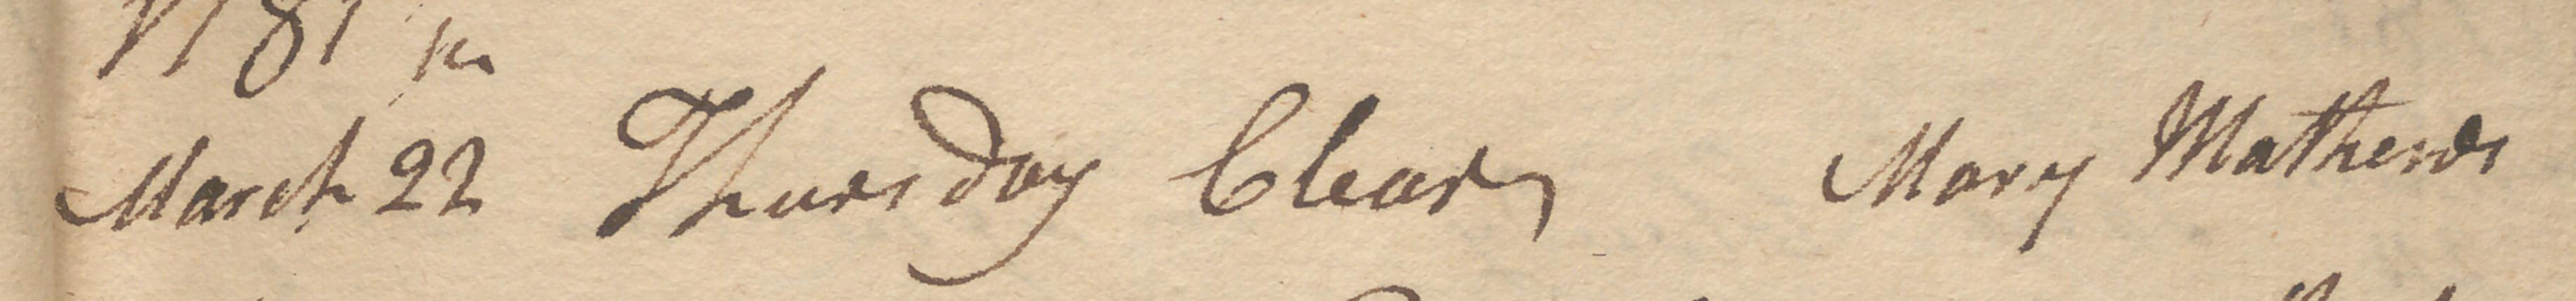March 22 Thursday Clear Mary Mathews
